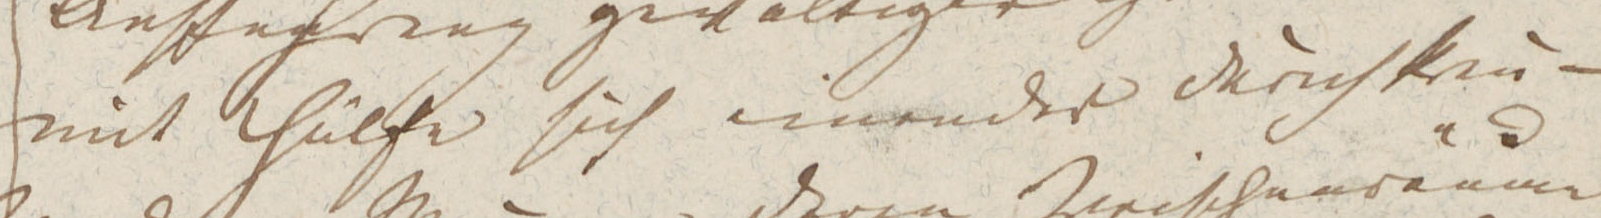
mit Hülfe sich einander durchkreu-
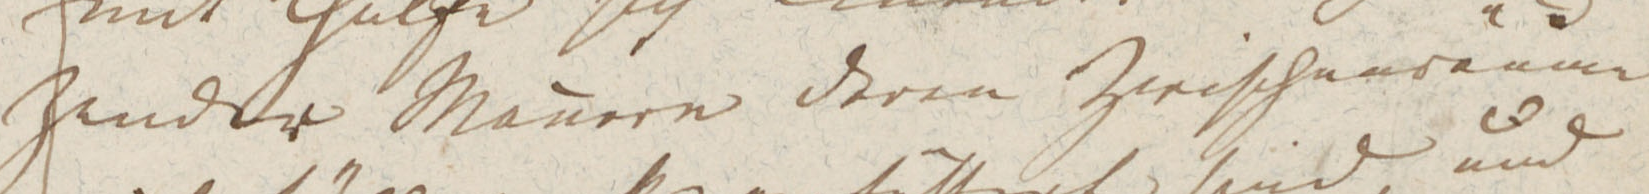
zender Mauern deren Zwischenräume
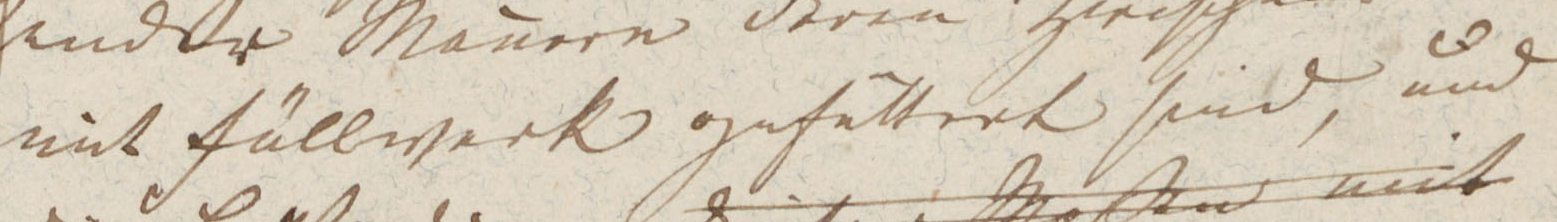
mit Füllwerk gefüttert sind, und
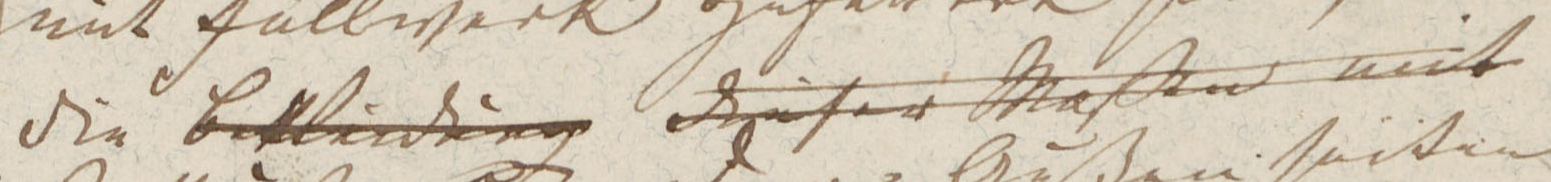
die Bekleidung dieser Massen mit
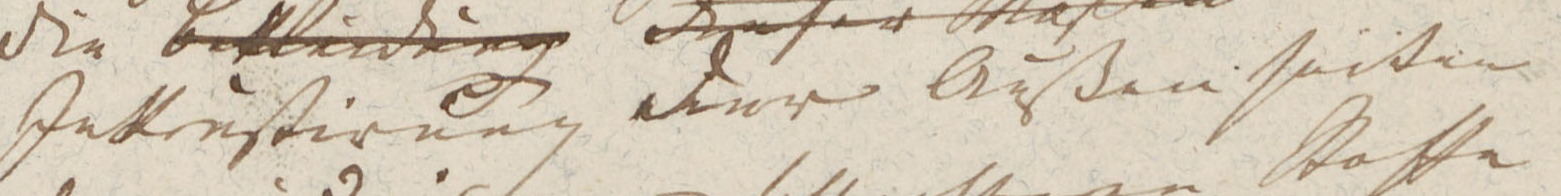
Inkrustirung ider Aussenseiten
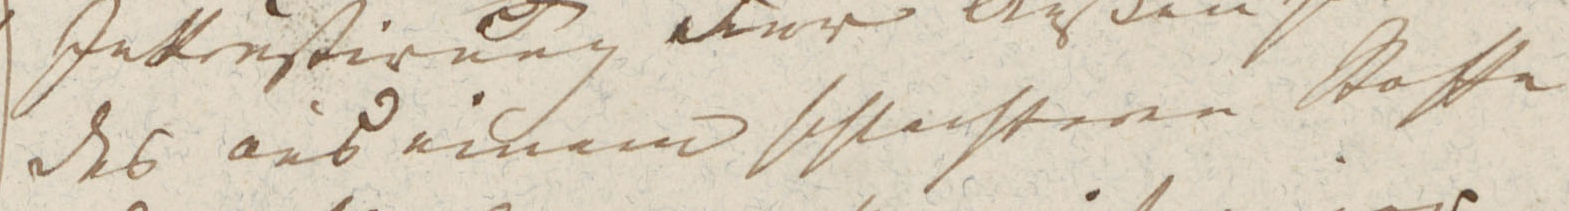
des aus einem schlechteren Stoffe
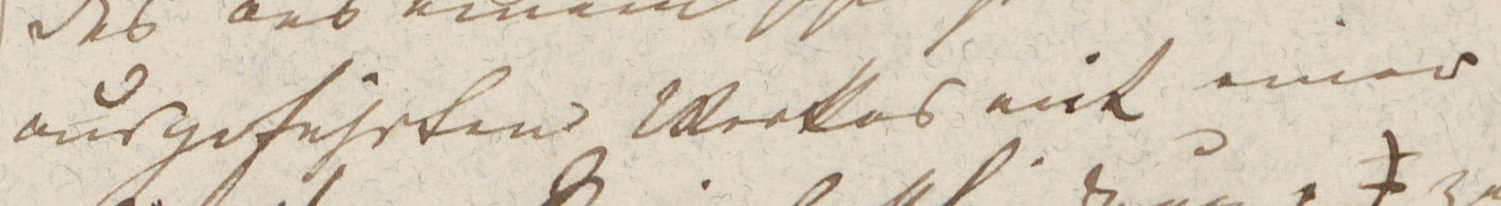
ausgeführten Werkes mit einer
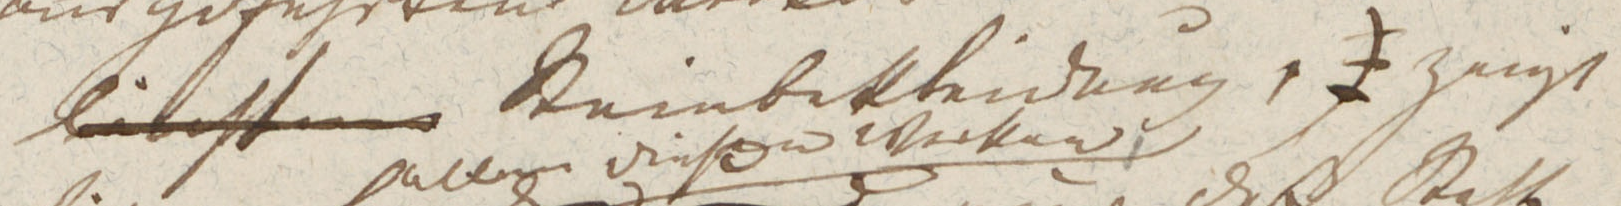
leichten Steinbekleidung,) zeigt
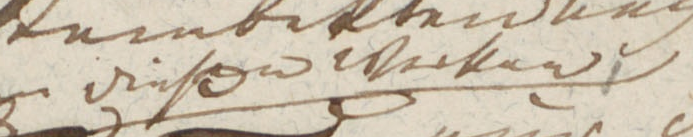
diesen Werken,,
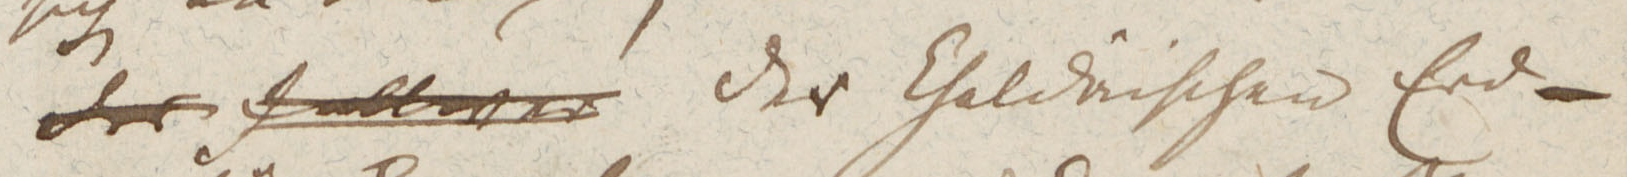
des Fullwer der Chaldäischen Erd-
